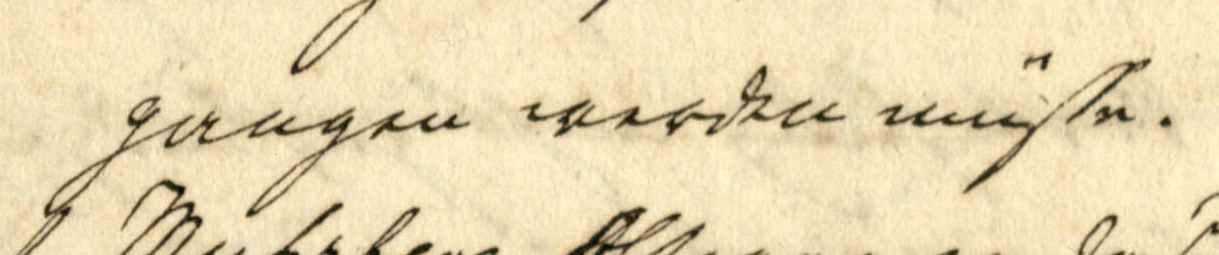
gangen werden müsse.
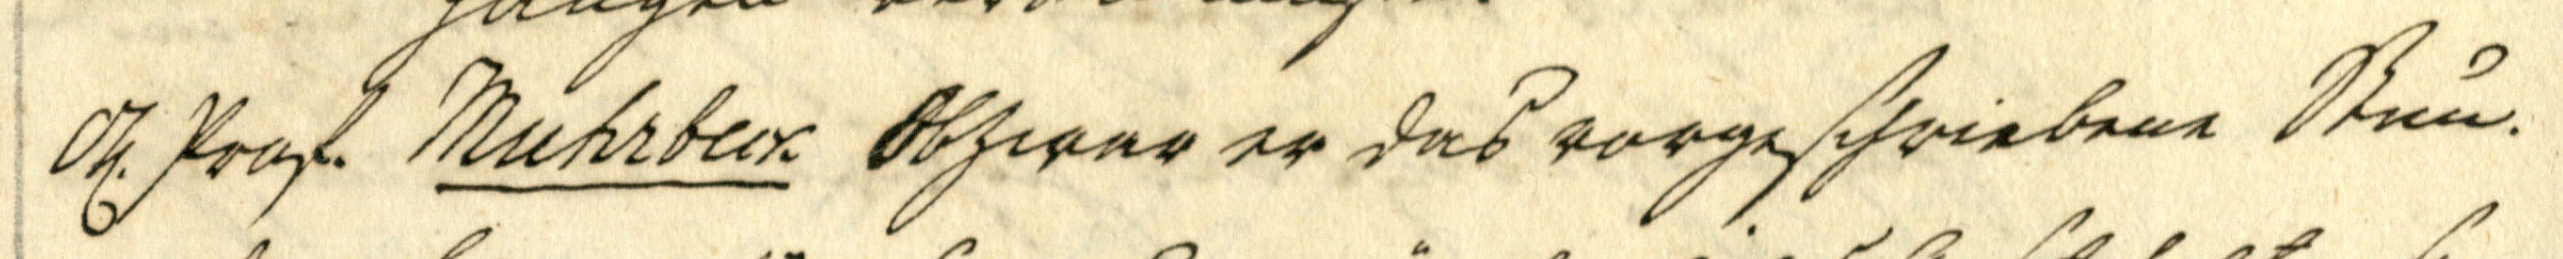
dh. Prof. Muhrbeck Obzwar er das vorgeschriebene Stun¬
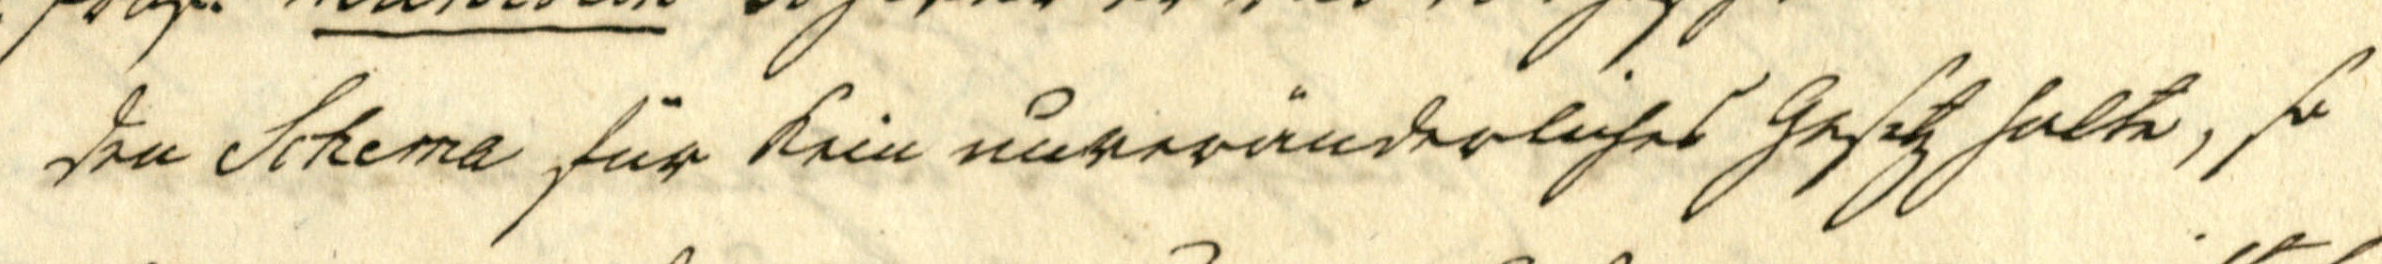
den Schema für kein unveränderliches Gesetz halte, so
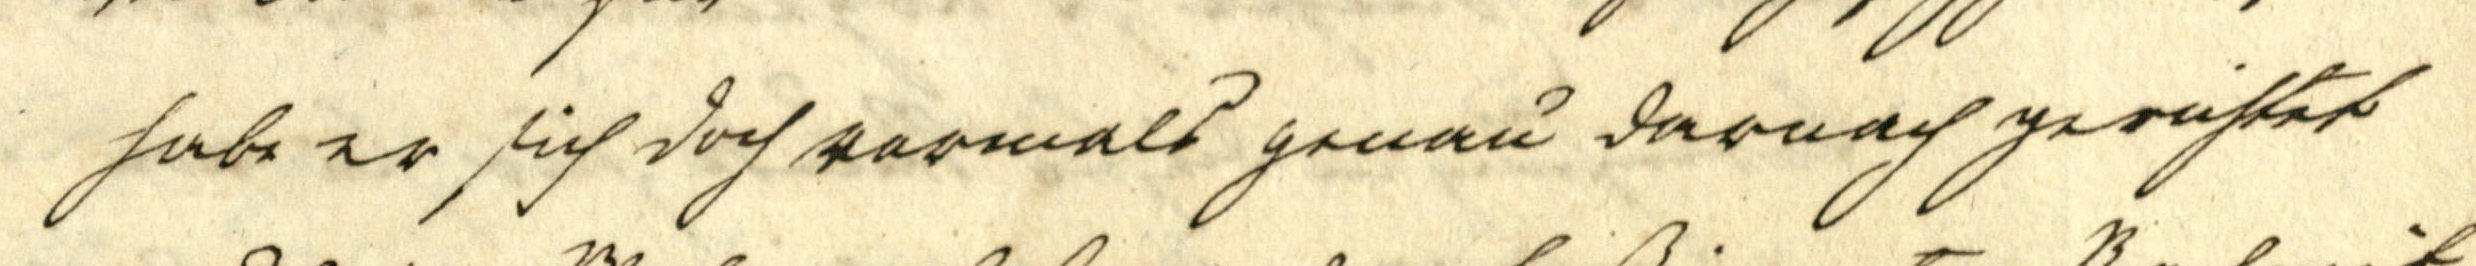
habe er sich doch vormals genau darnach gerichtet
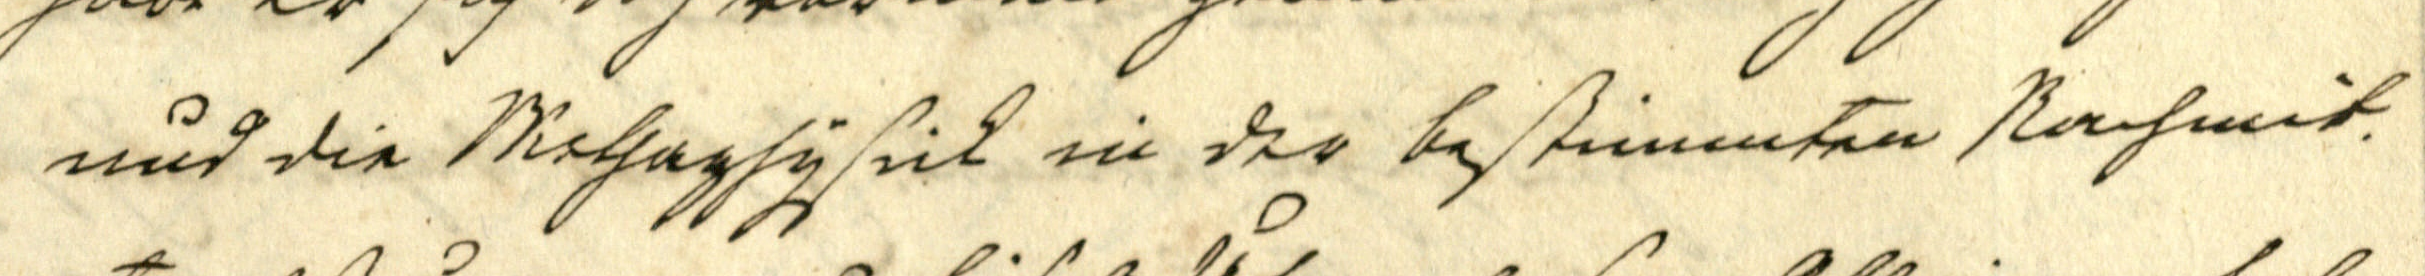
und die Methaphysick in der bestimmten Nachmit¬
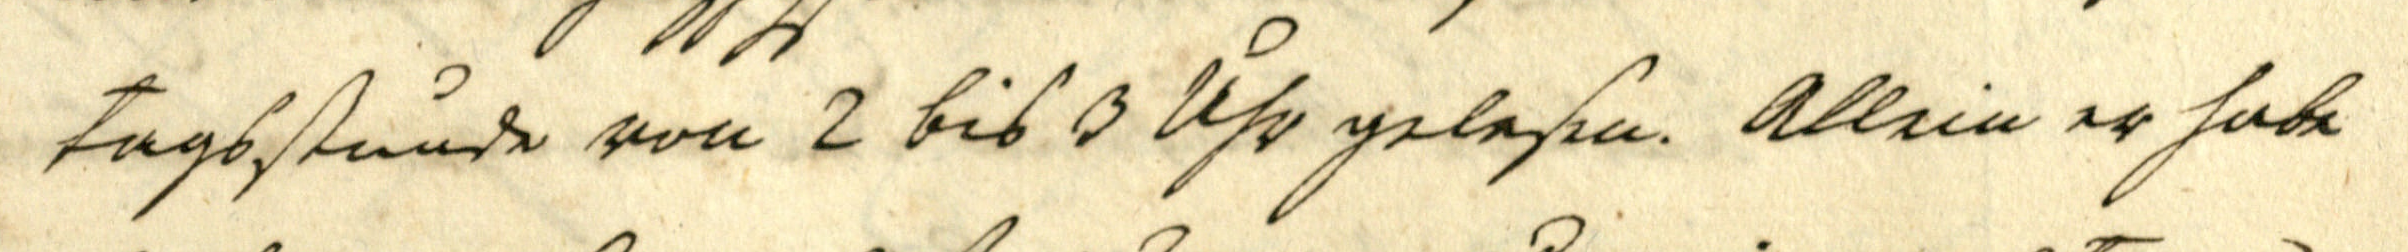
tagsstunde von 2 bis 3 Uhr gelesen. Allein er habe
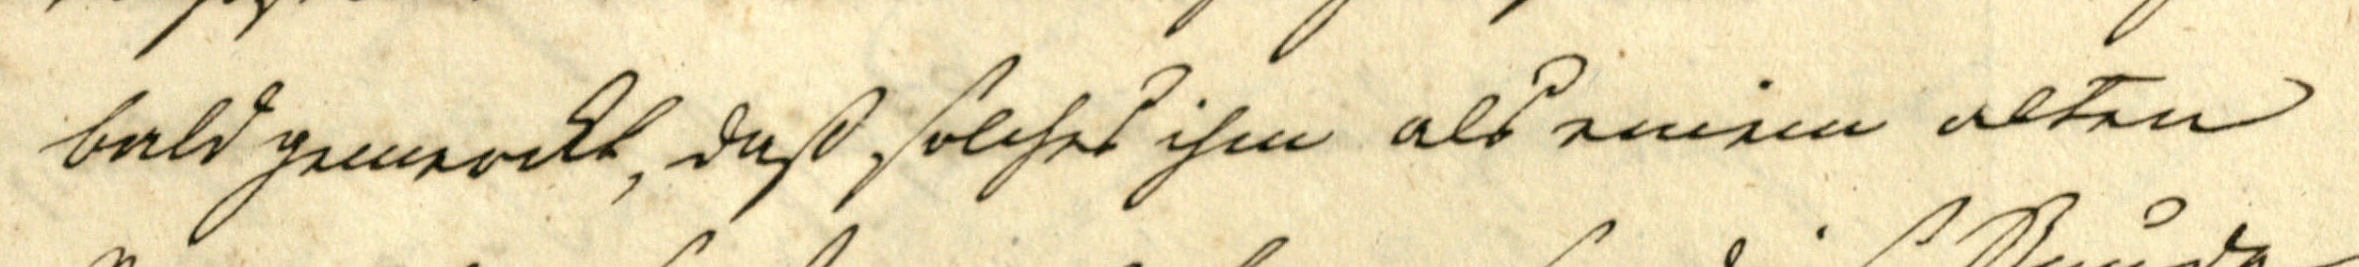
bald gemerckt, daß solches ihm als einem alten
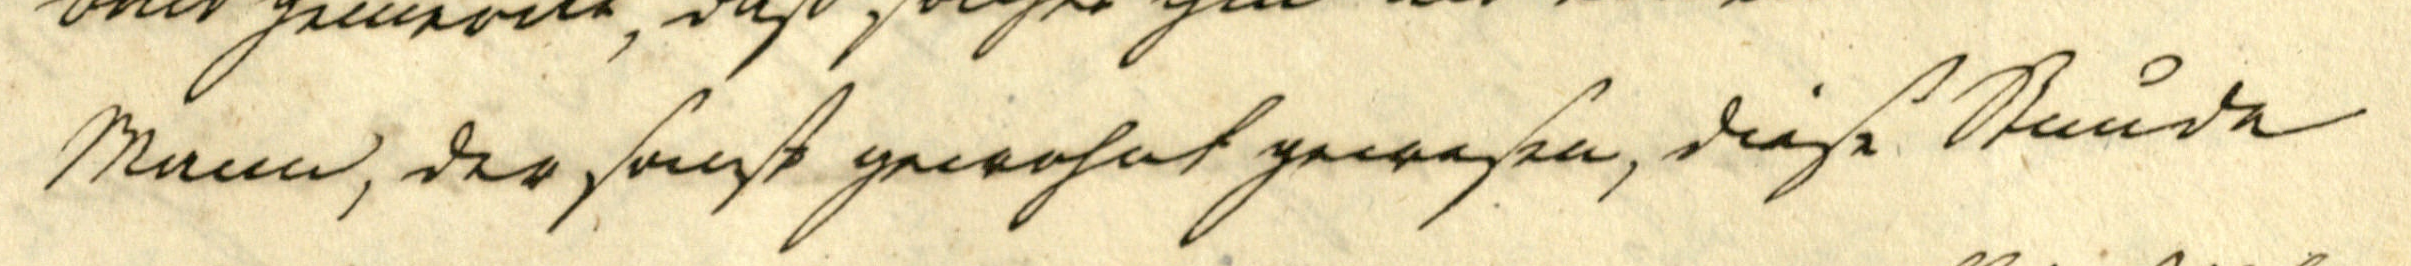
Mann, der sonst gewohnt gewesen, diese Stunde
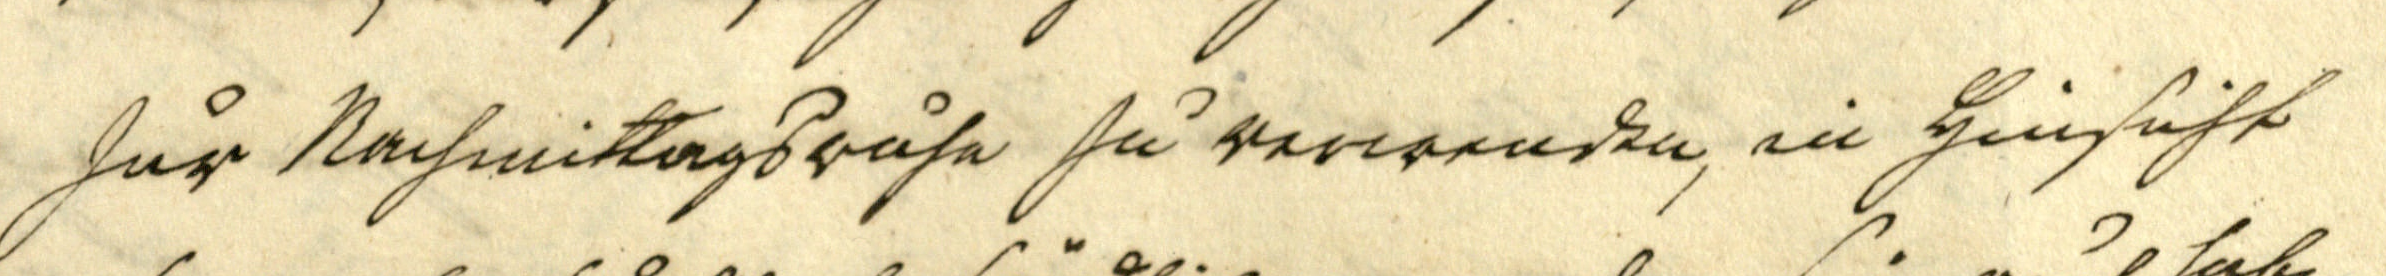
zur Nachmittagsruhe zu verwenden, in Hinsicht
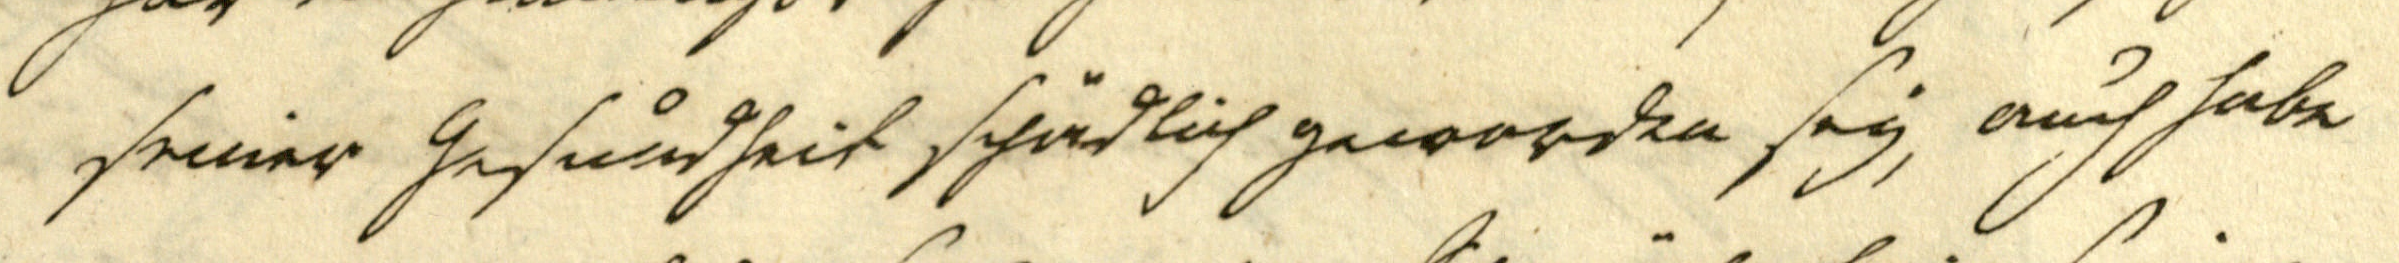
seiner Gesundheit schädlich geworden seÿ, auch habe
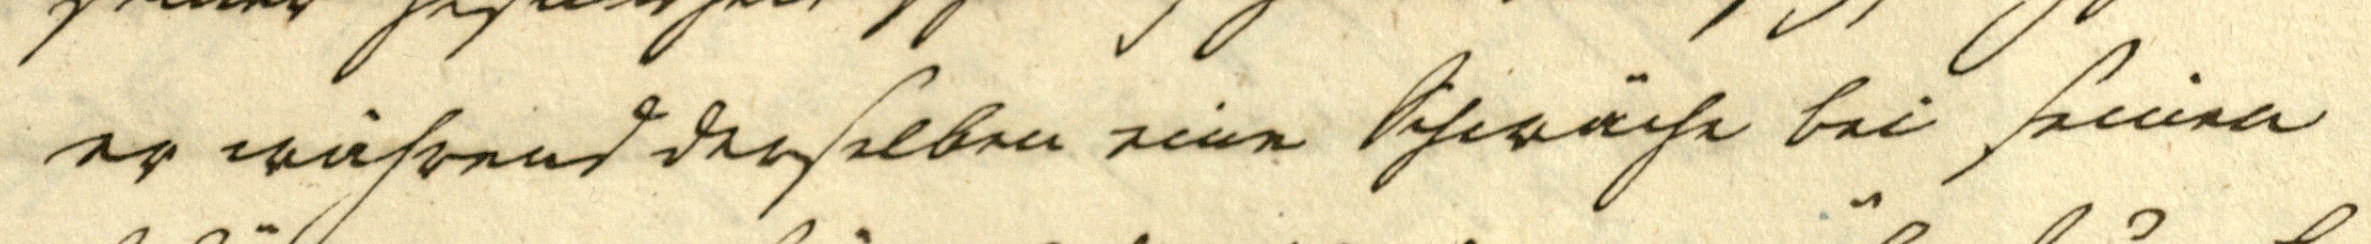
er während derselben eine Schwäche bei seinen
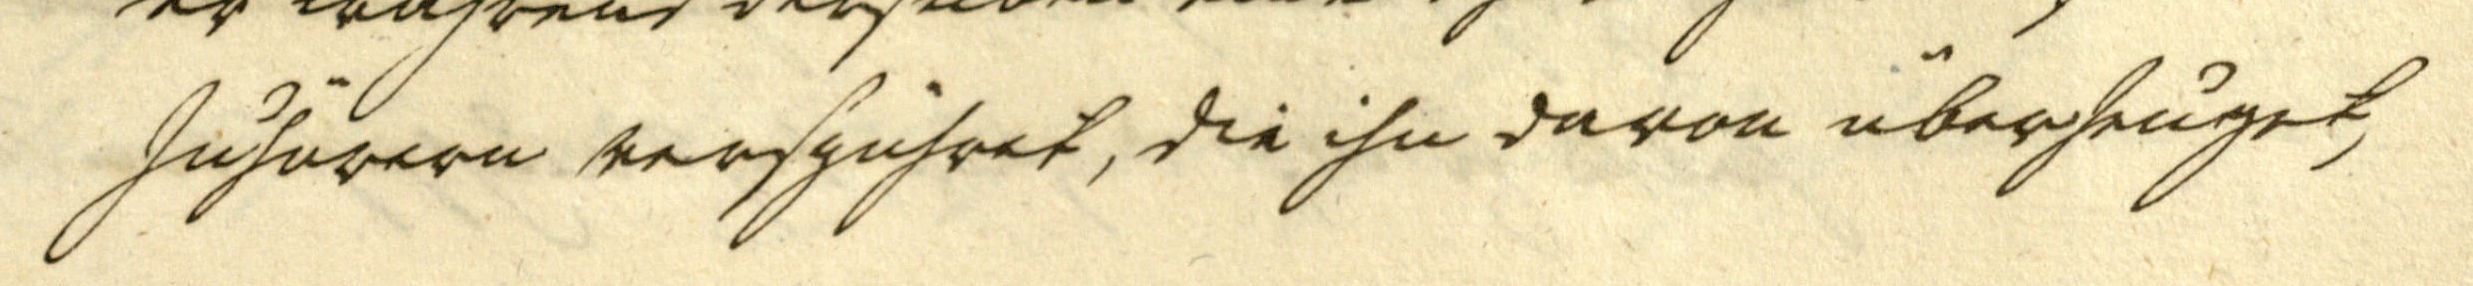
Zuhörern verspühret, die ihn davon überzeuget,
